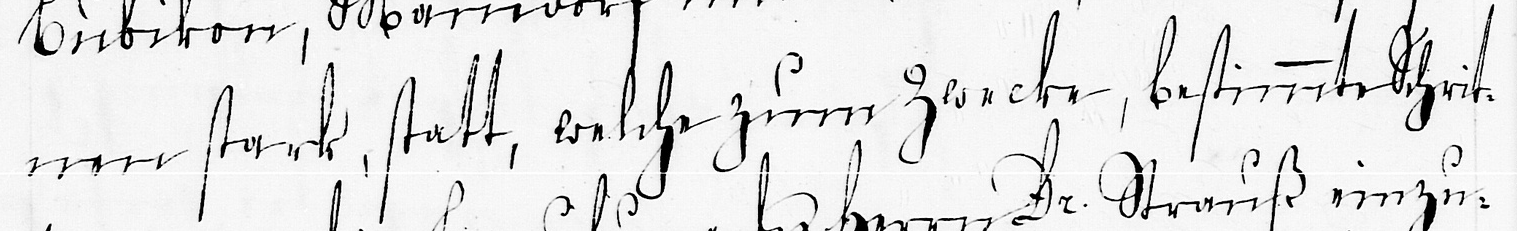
nen stark, statt, welche zum Zwecke, bestimmte Schri¬
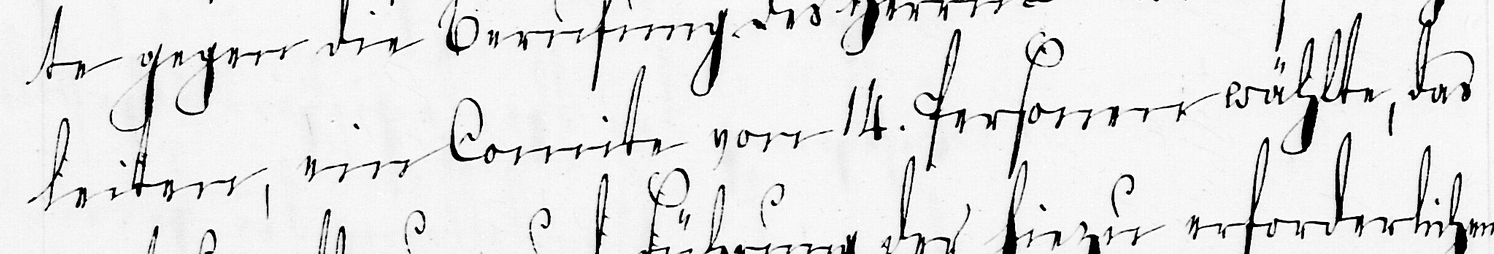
leiten, ein Comite von 14. Personen wählte, das
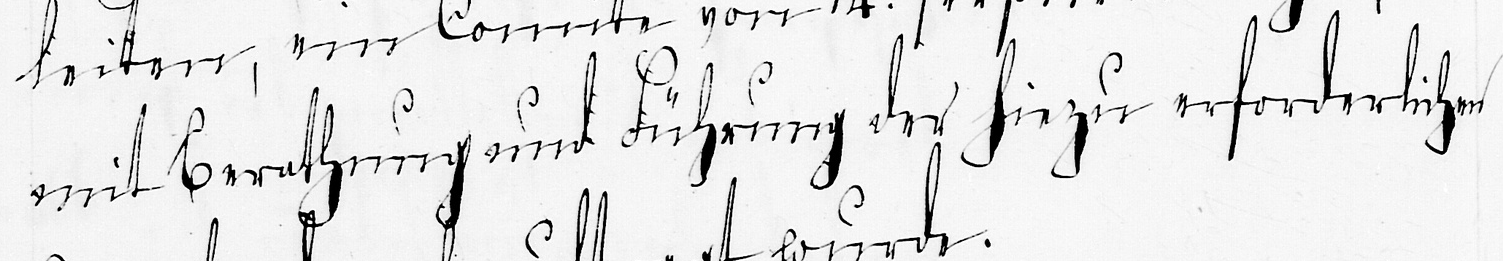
mit Berathung und Führung der hiezu erforderlich¬
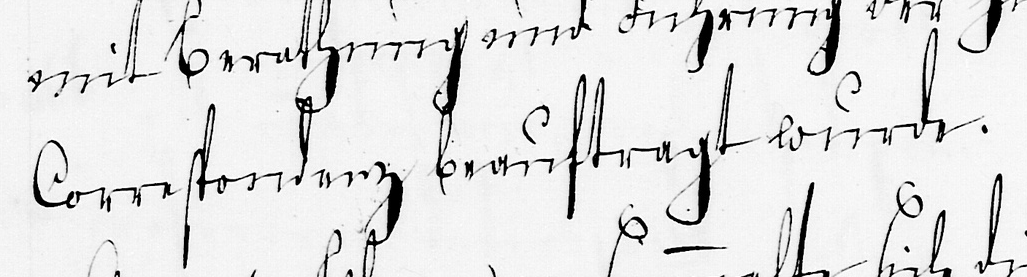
Correspondenz beauftragt wurde.
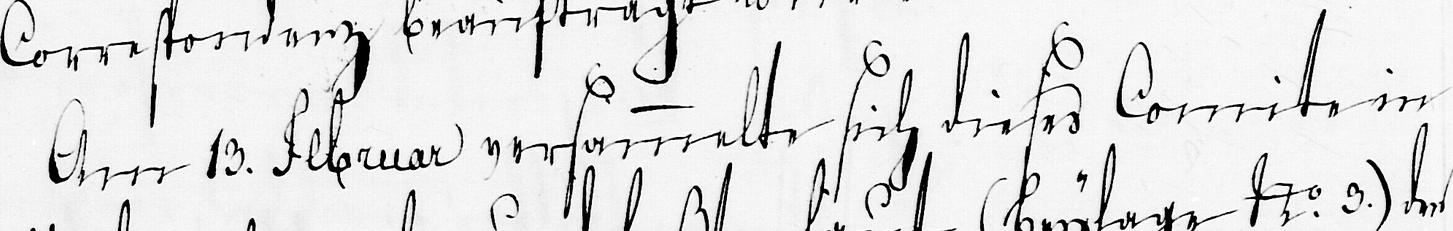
Am 13. Februar versammelte sich dieses Comite in
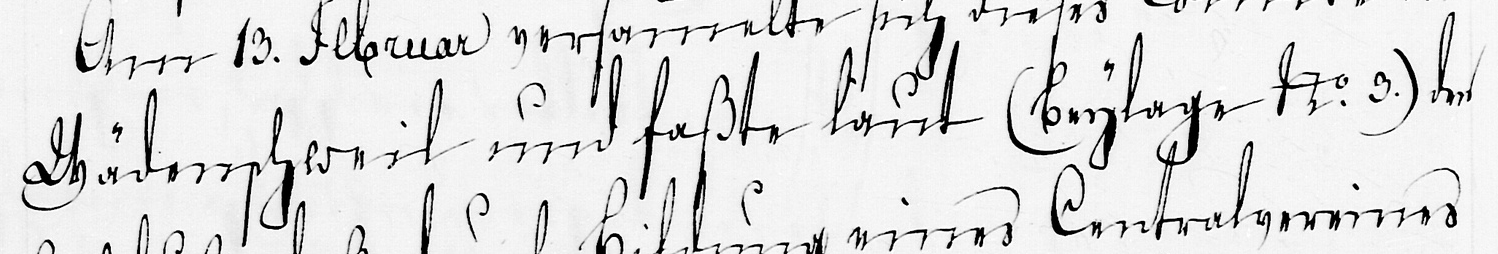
Wädenschweil und faßte laut (Beylage No. 3.) d¬
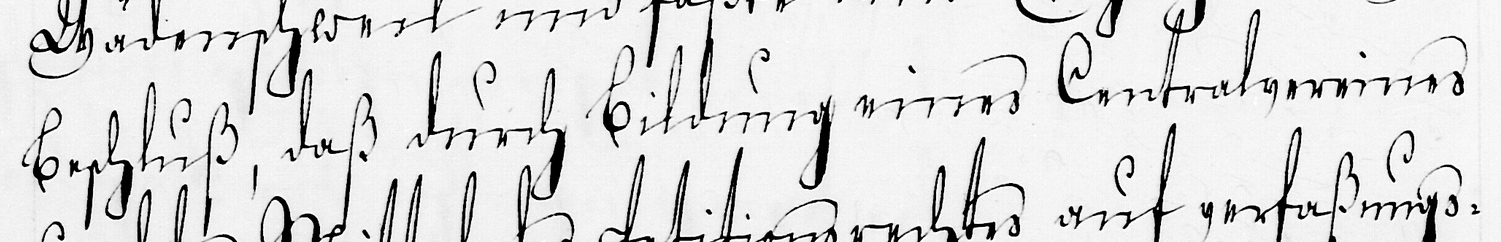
Beschluß, daß durch Bildung eines Centralvereines
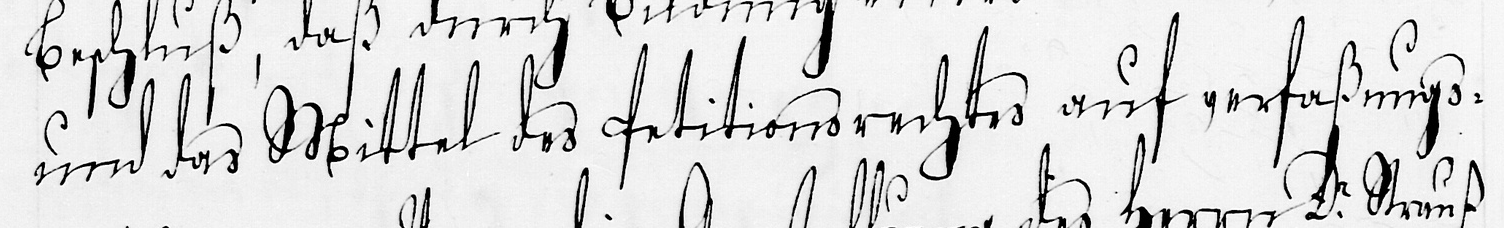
und das Mittel des Petitionsrechtes auf verfaßungs¬
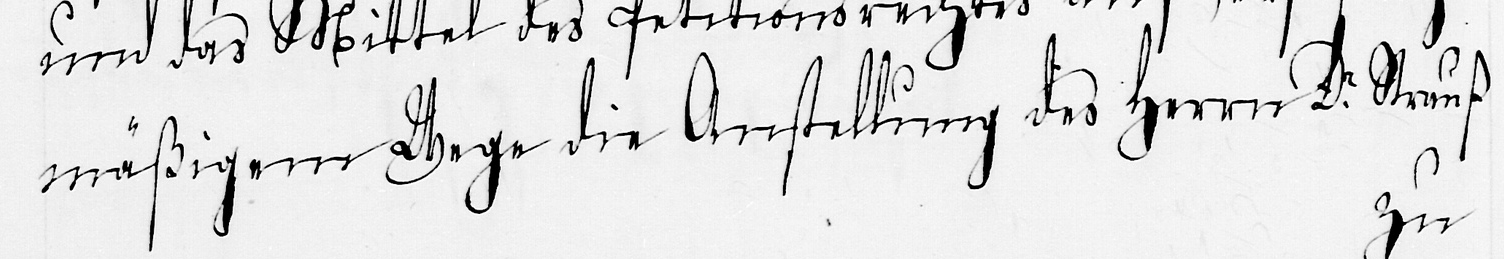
mäßigem Wege die Anstellung des Herrn Dr. Strauß
